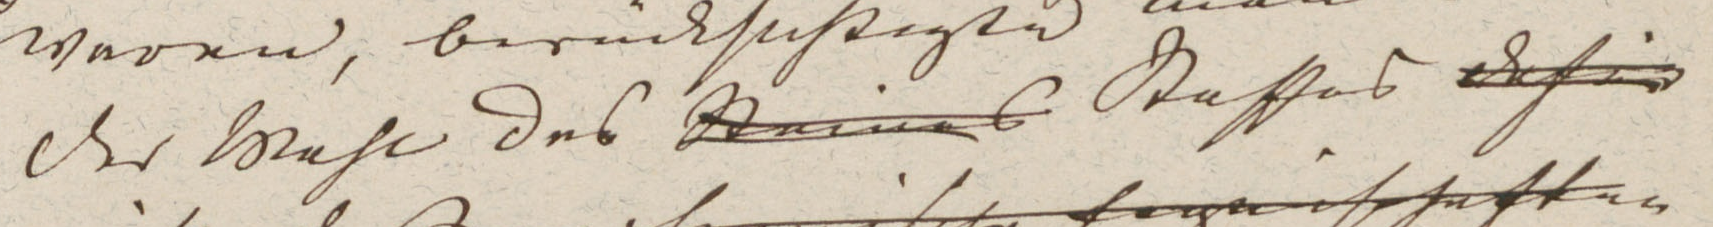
der Wahl des Steines Stoffes dafür
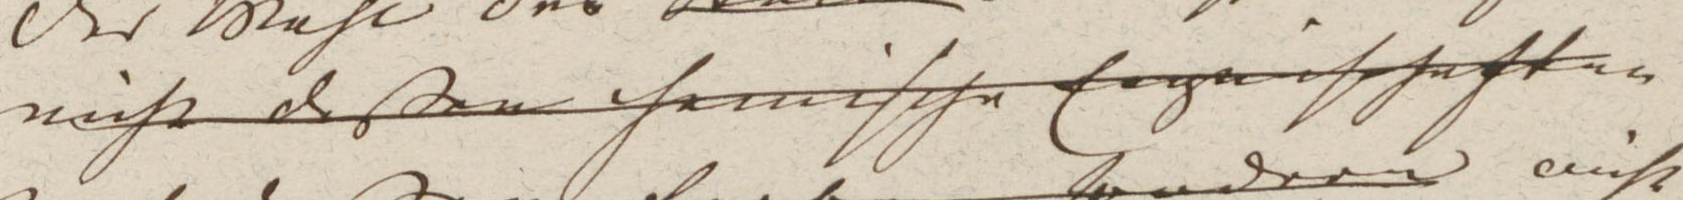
nicht dessen chemische Eigenschaften
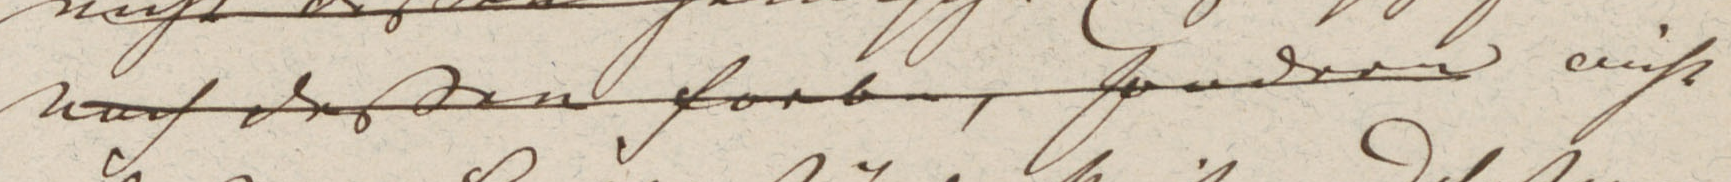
noch dessen Farbe, sondern nicht
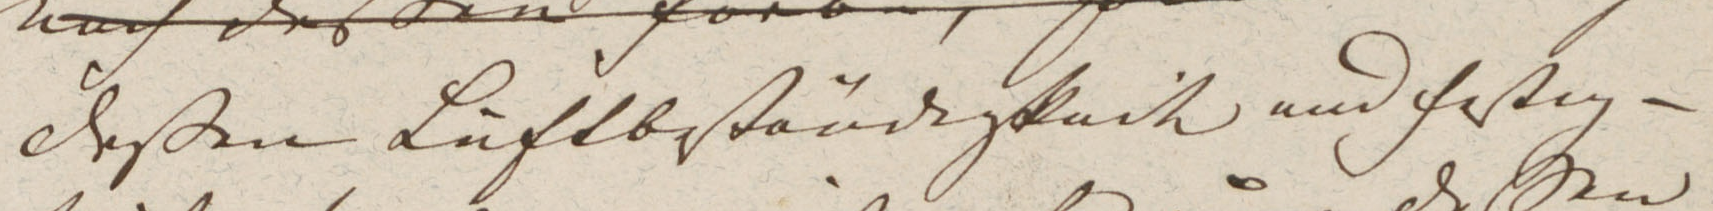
dessen Luftbeständikgkeit und Festig-
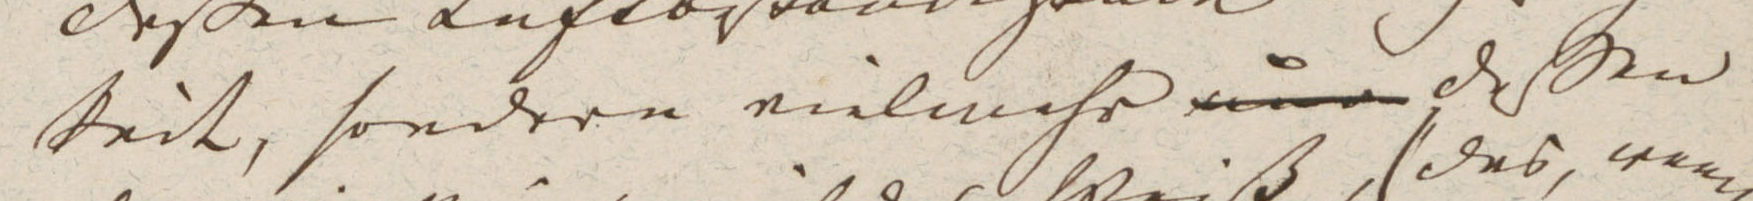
keit, sondern vielmehr nur dessen
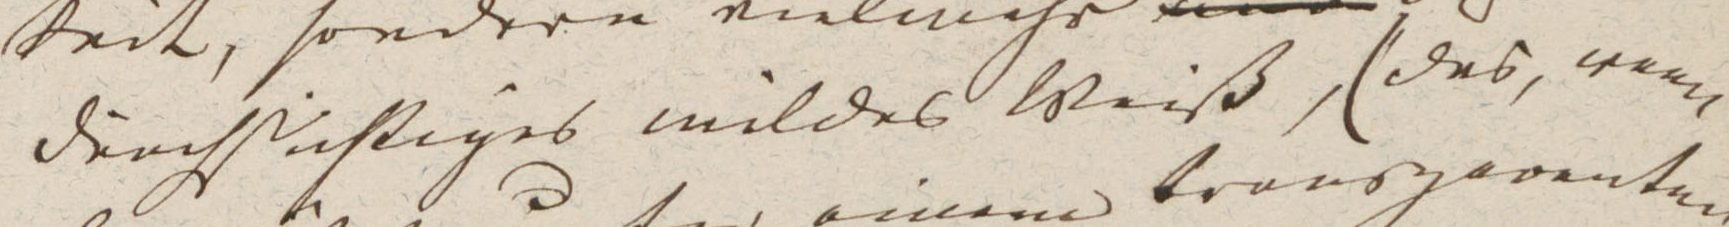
durchsichtiges mildes Weiss, (das, wenn
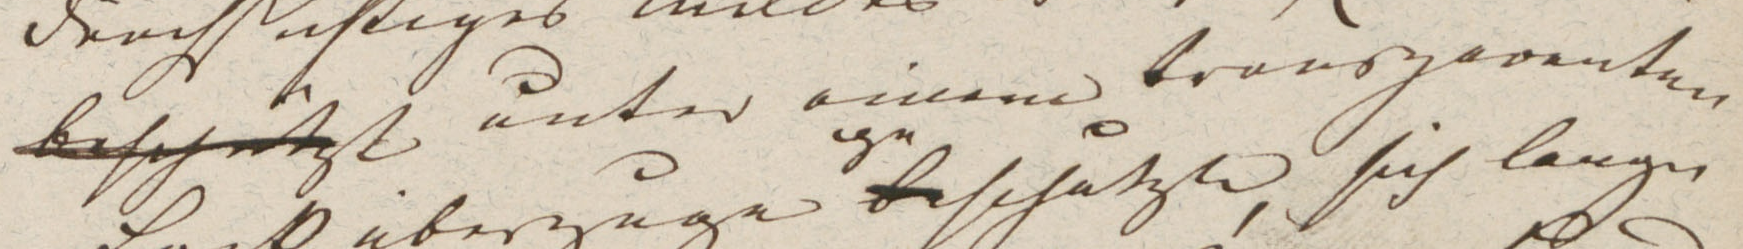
beschützt unter einem transparenten
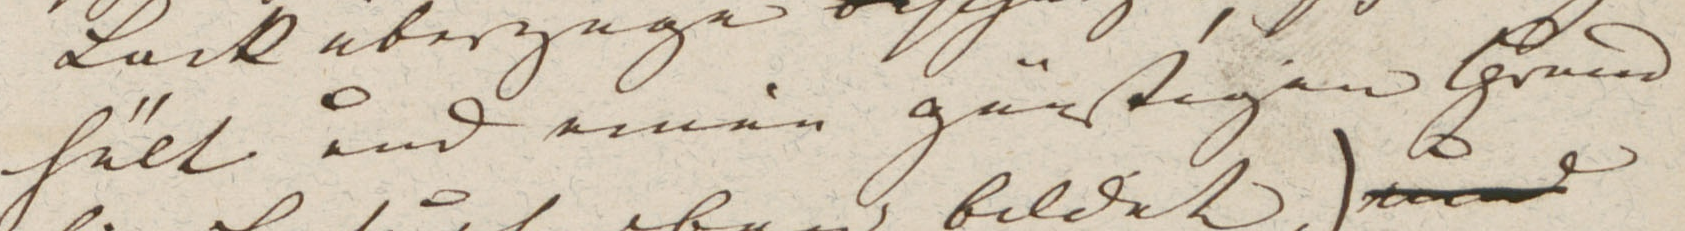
hält und einen günstigen Grund
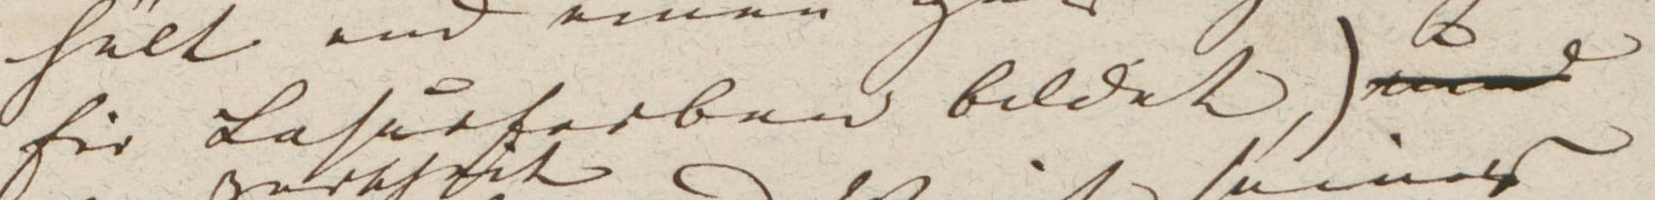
für Lasurfarben bildet,) und
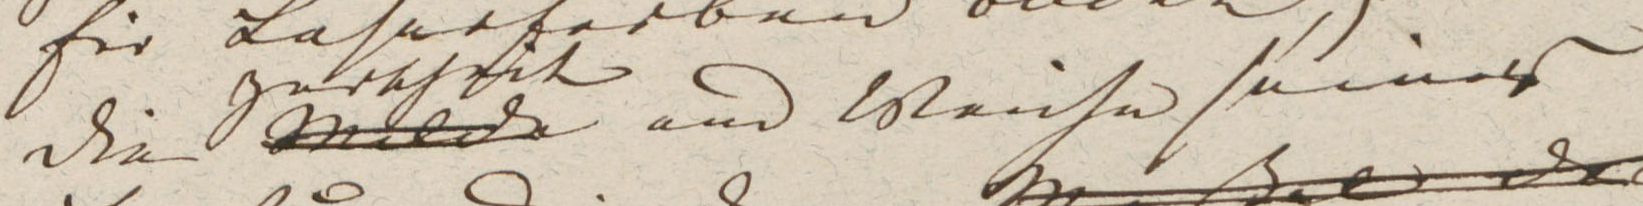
die Milde Zartheit und Weise seinesr
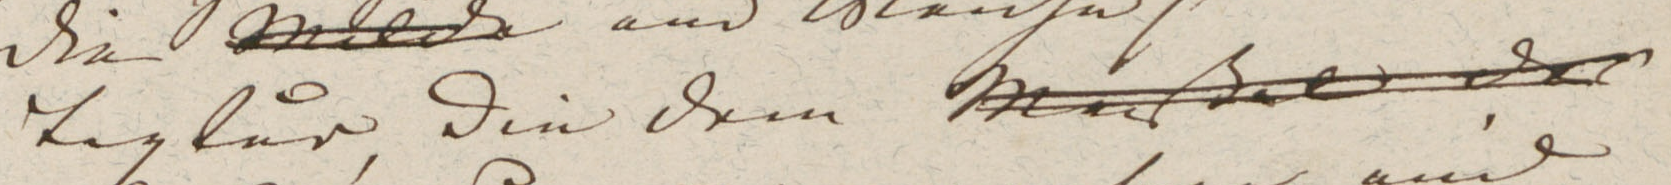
Textur, die dem Meissel des
